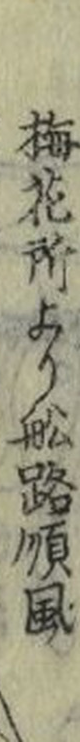梅花所により舩路順風
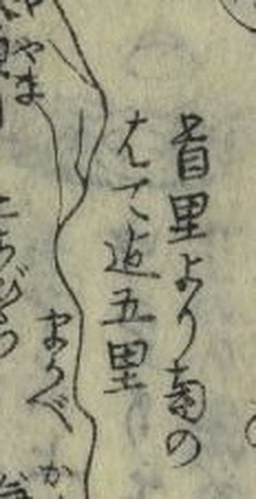はて迠五里
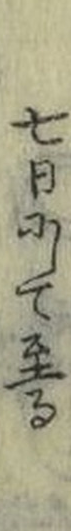七日にして至
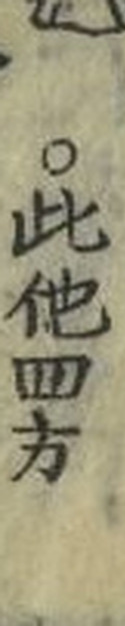〇此他四方
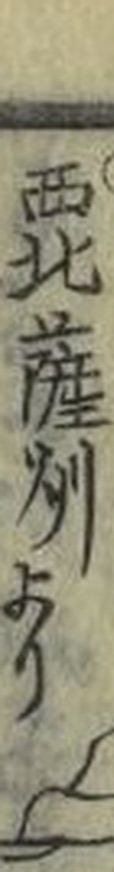〇西北薩州より
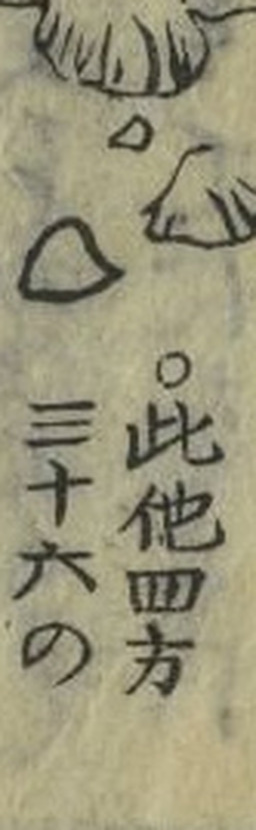三十六の
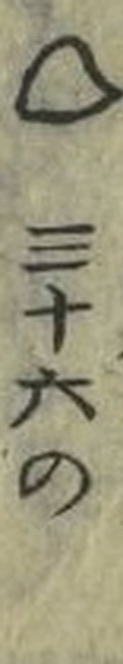三十六の
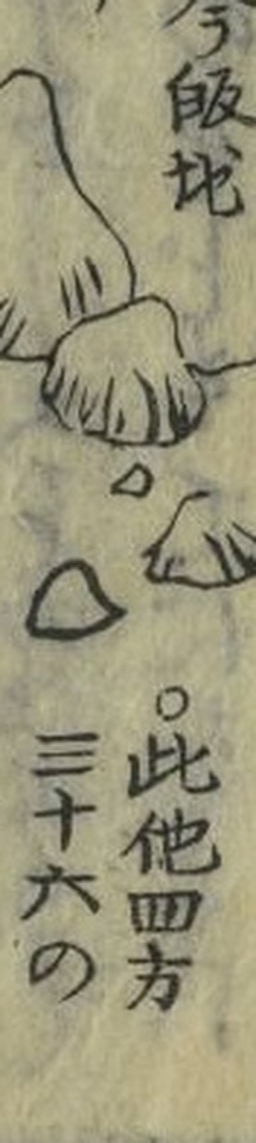三十六の
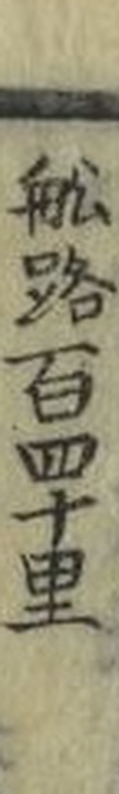舩路百四十里
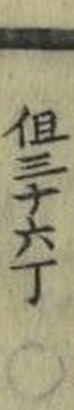但三十六丁
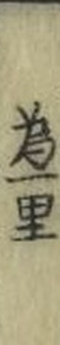為一里
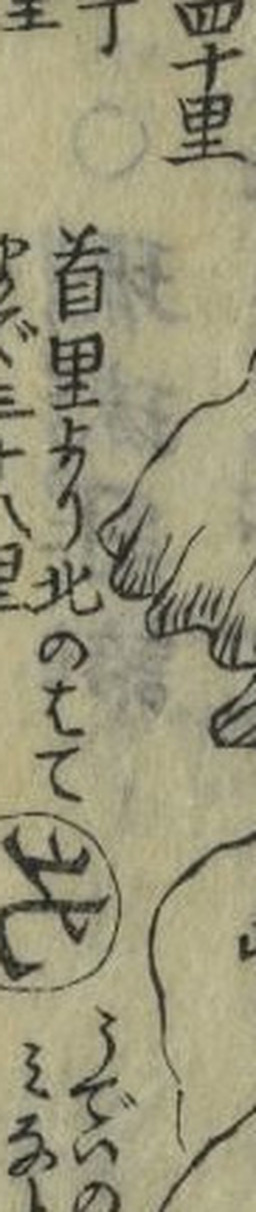首里より北のはて
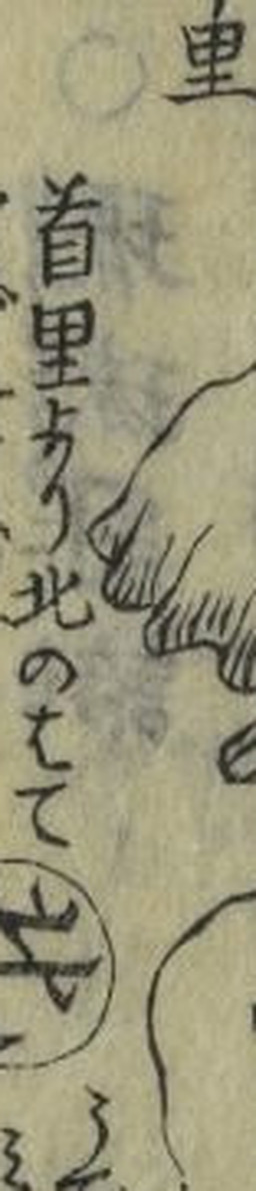首里より北のはて
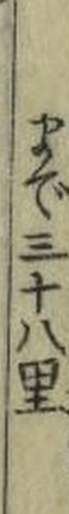まで三十八里

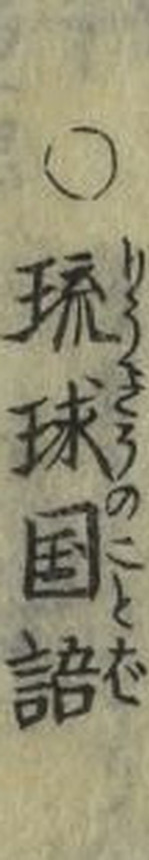〇琉球国語
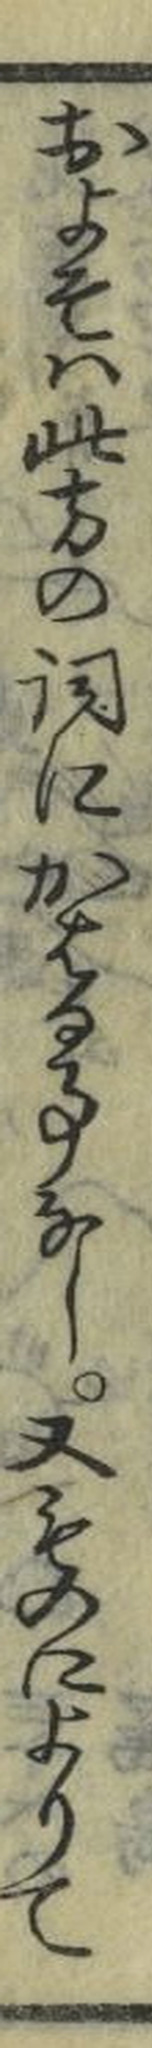およそハ此方の詞にかはる事なし。又ものによりて
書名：琉球奇譚
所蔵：University of the Ryukyus Library
